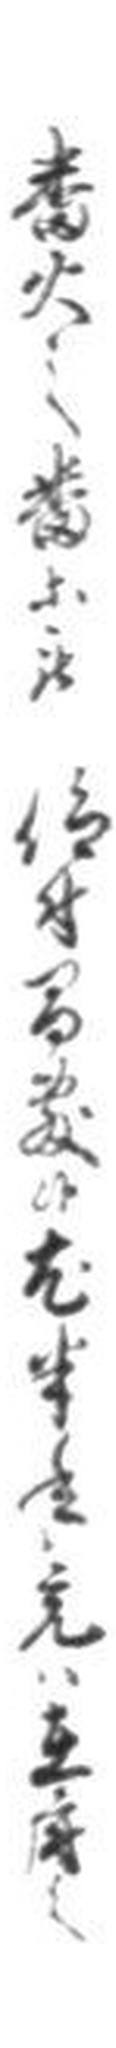番火之番等被仰付間敷候尤半年充ハ在府之
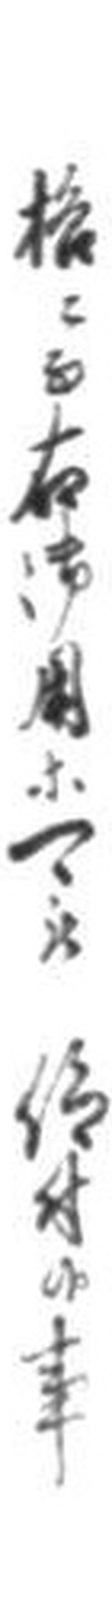格ニ而右御用等可被仰付候事
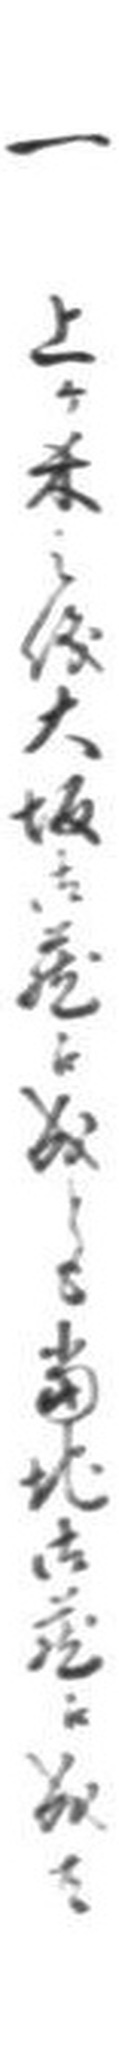一上ケ米之儀大坂御蔵江成とも当地御蔵江成共
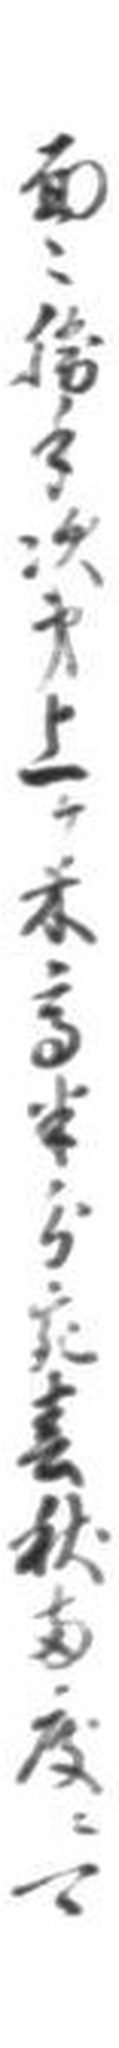面々勝手次第上ケ米高半分宛春秋両度ニ可
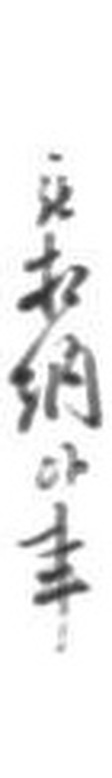被相納候事
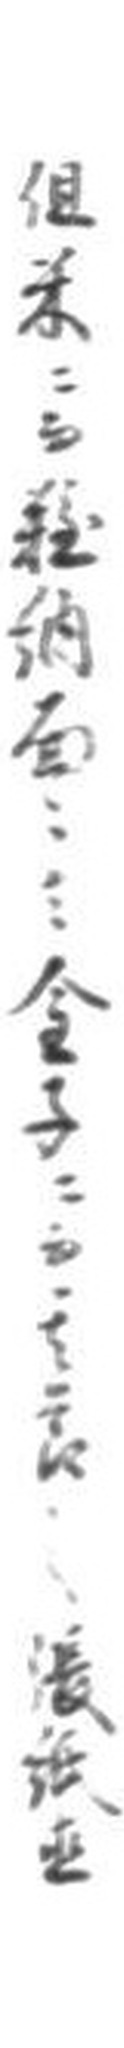但米ニ而難納面々者金子ニ而其節之張紙直
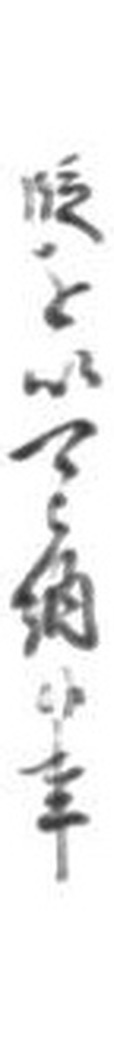段を以可被納候事
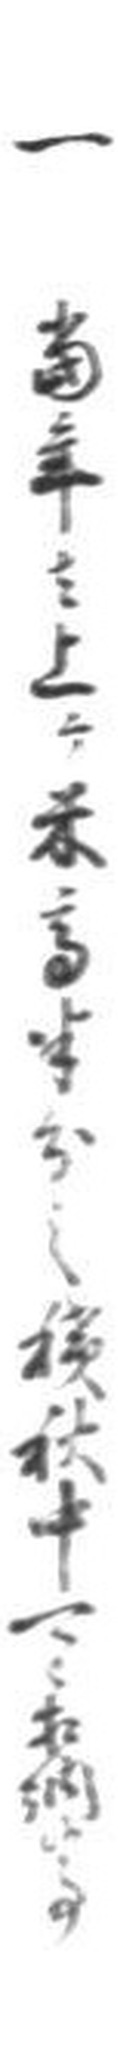一当年者上ケ米高半分之積秋中可被相納候事
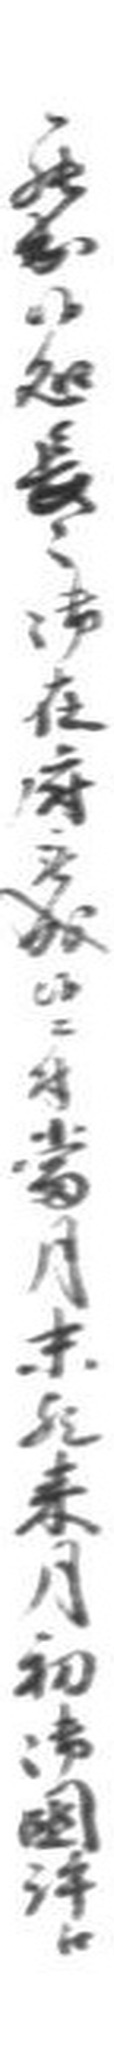罷出候処長々御在府被成候ニ付当月末歟来月初御国許江

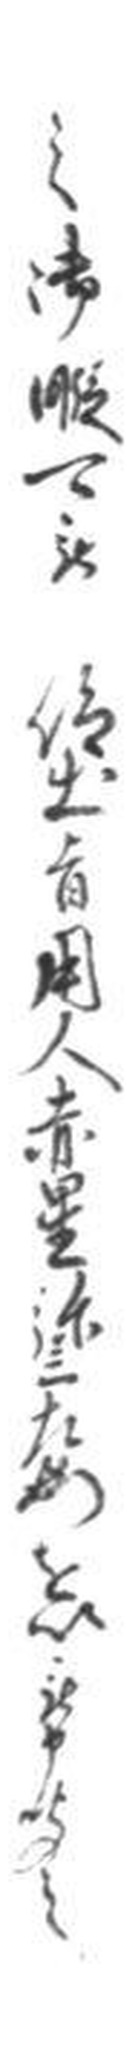之御暇可被仰出旨用人赤星弥三左衛門を以被申聞之
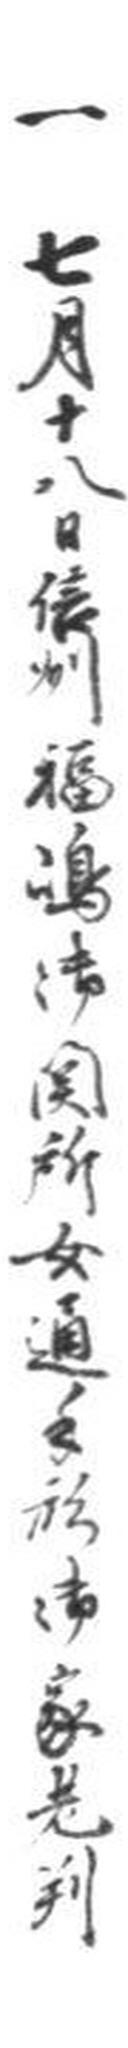一七月十八日信州福嶋御関所女通手形御家老判
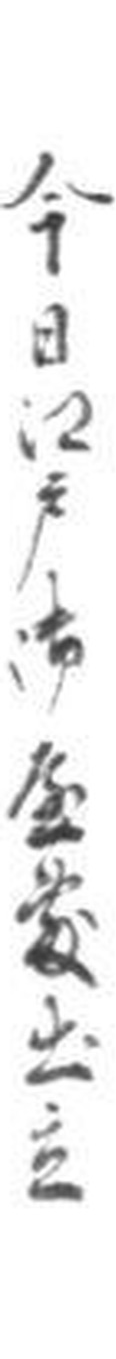今日江戸御屋敷出立
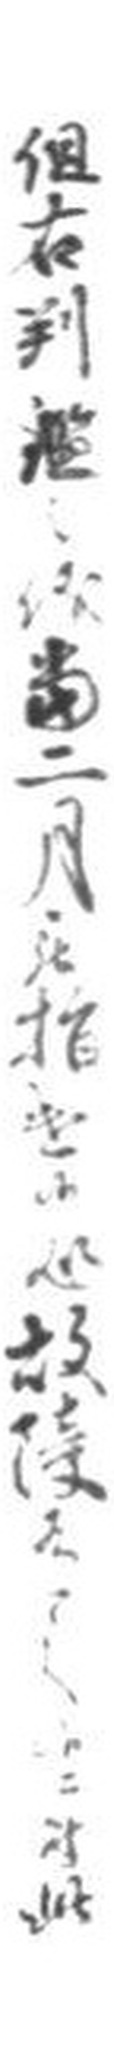但右判鑑之儀当二月被指遣候処故障有之候ニ付此
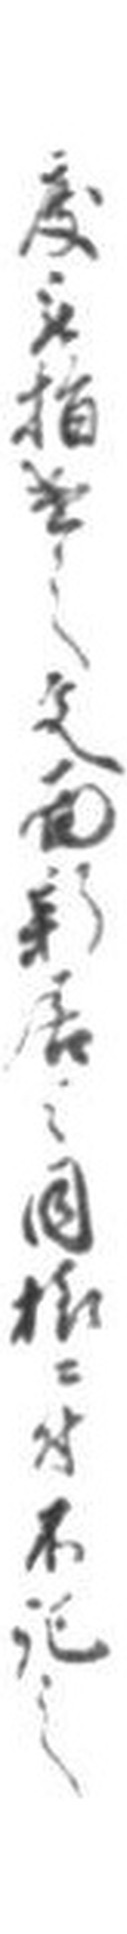度被指遣之文面新居与同様ニ付不記之
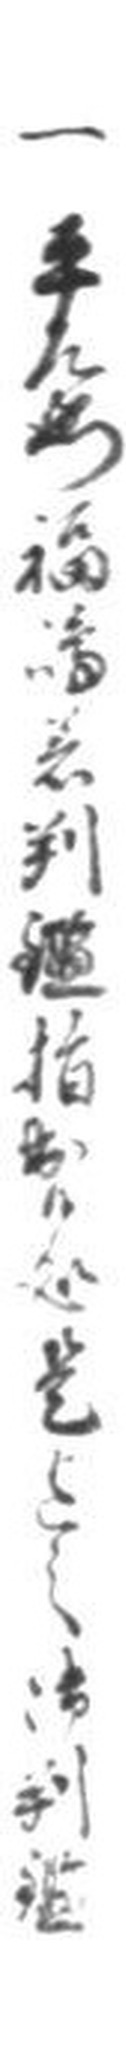一平左衛門福嶋着判鑑指出候処是迄之御判鑑
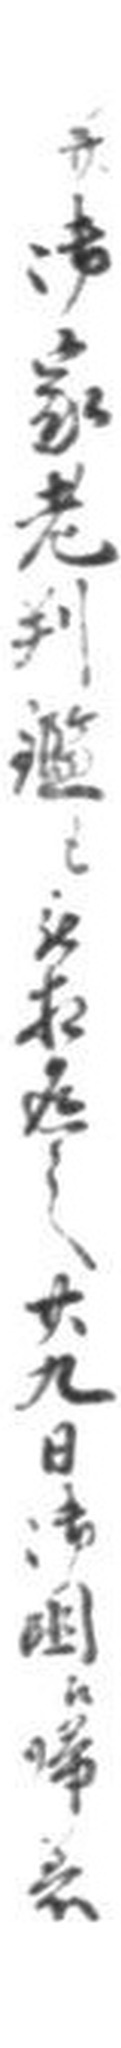并御家老判鑑も被相返之廿九日御国江帰着
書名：家譜 三十五 宗昌公 従享保六年到同七年
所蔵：福井県文書館 Fukui Prefectural Archives
